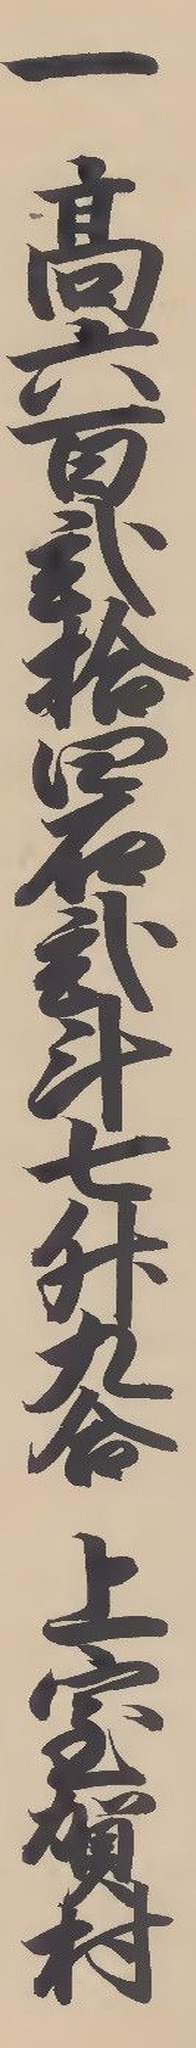一高六百弐拾四石弐斗七升九合上室賀村
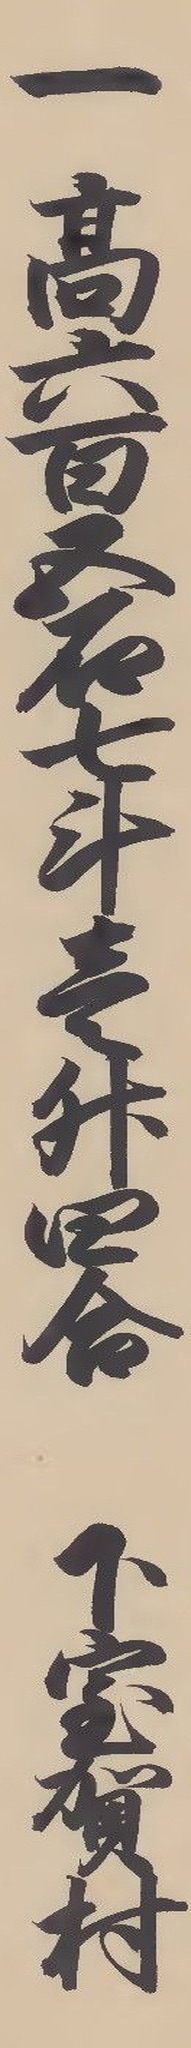一高六百五石七斗壱升四合下室賀村
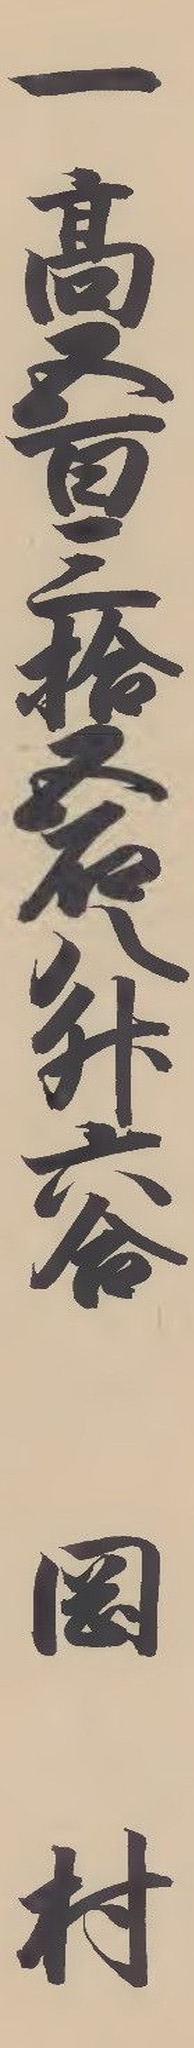一高五百三拾五石八升六合岡村
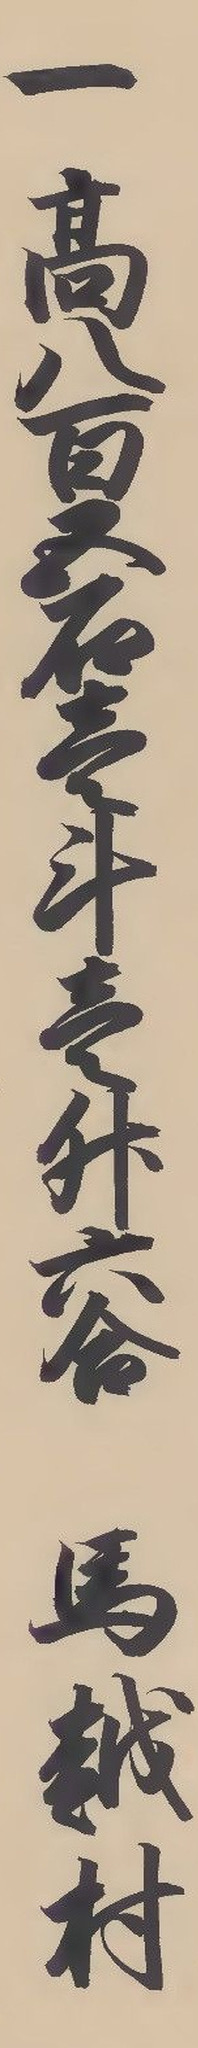一高八百五石壱斗壱升六合馬越村

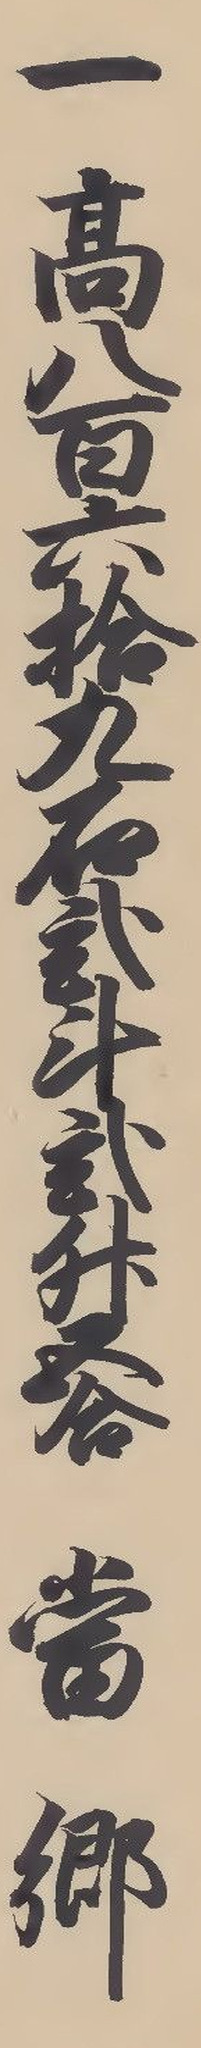一高八百六拾九石弐斗弐升五合当郷
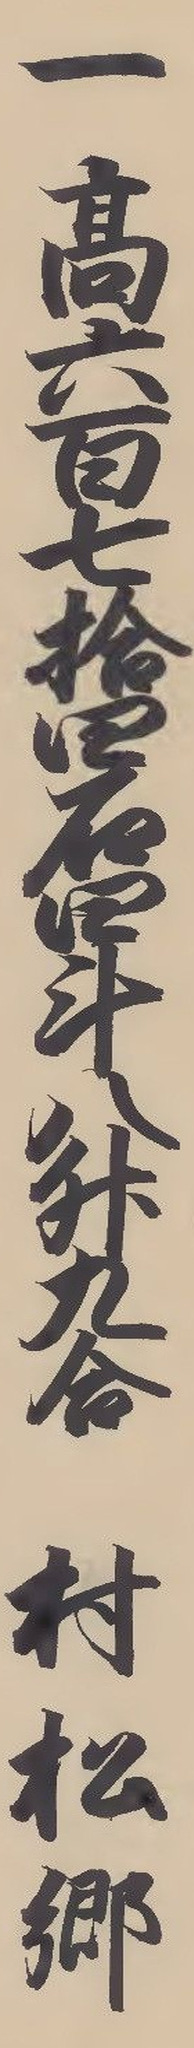一高六百七拾四石四斗八升九合村松郷
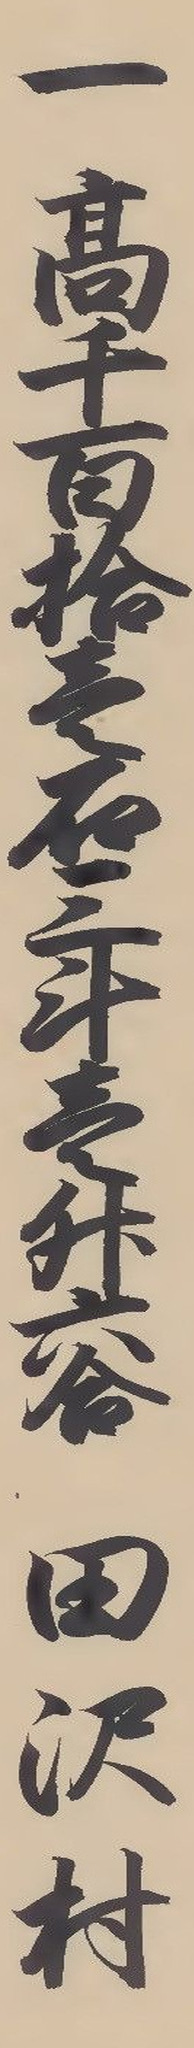一高千百拾壱石三斗壱升六合田沢村
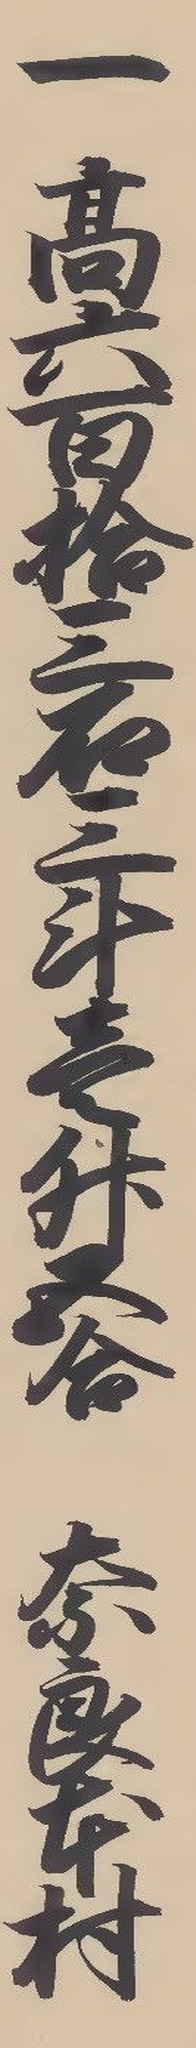一高六百拾三石三斗壱升五合奈良本村
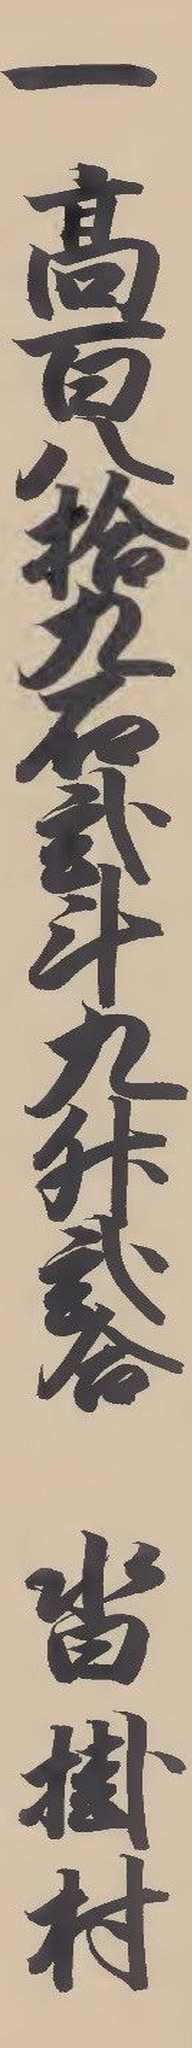一高百八拾九石弐斗九升弐合沓掛村
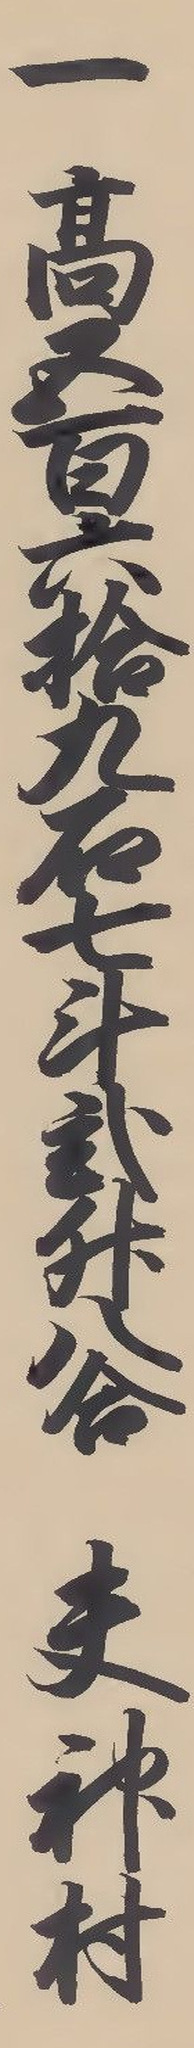一高五百六拾九石七斗弐升八合夫神村
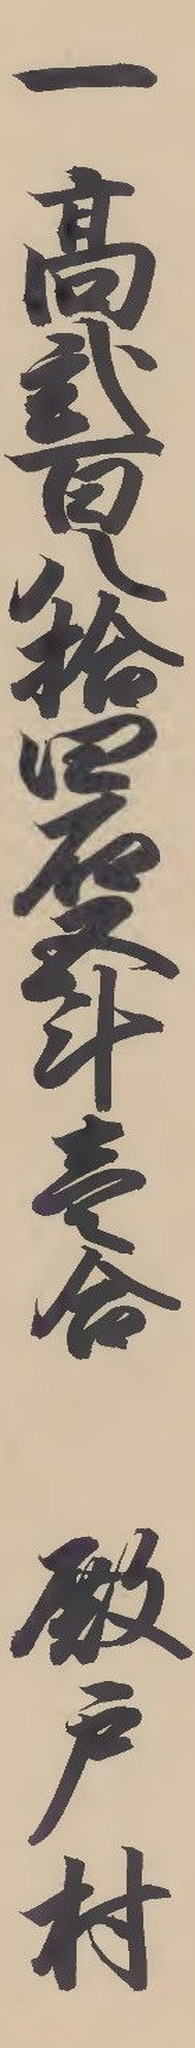一高弐百八拾四石五斗壱合殿戸村
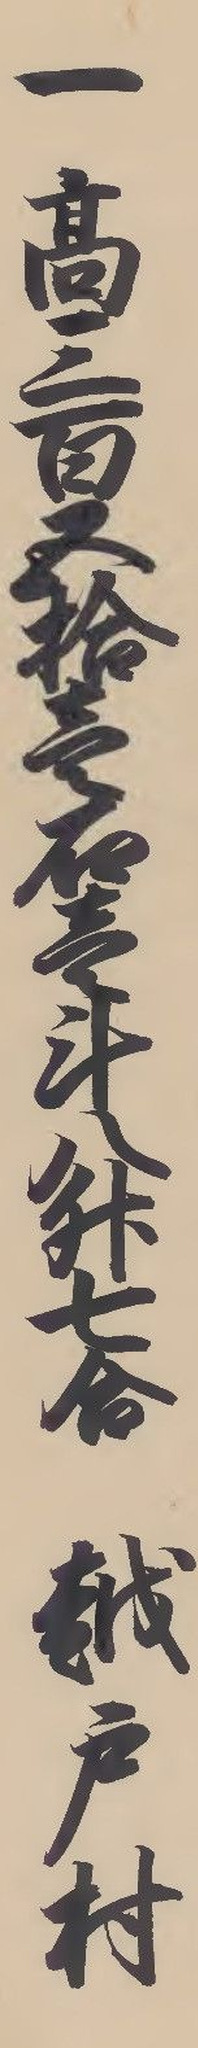一高三百五拾壱石壱斗八升七合越戸村

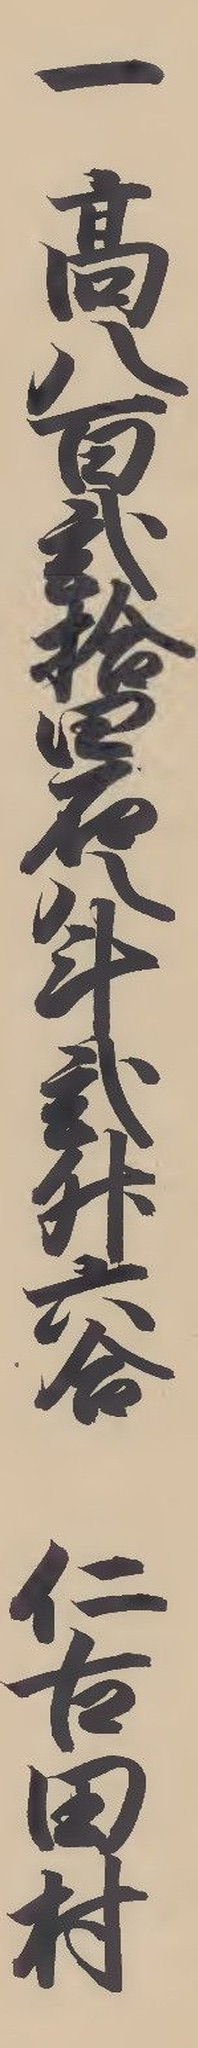一高八百弐拾四石八斗弐升六合仁古田村
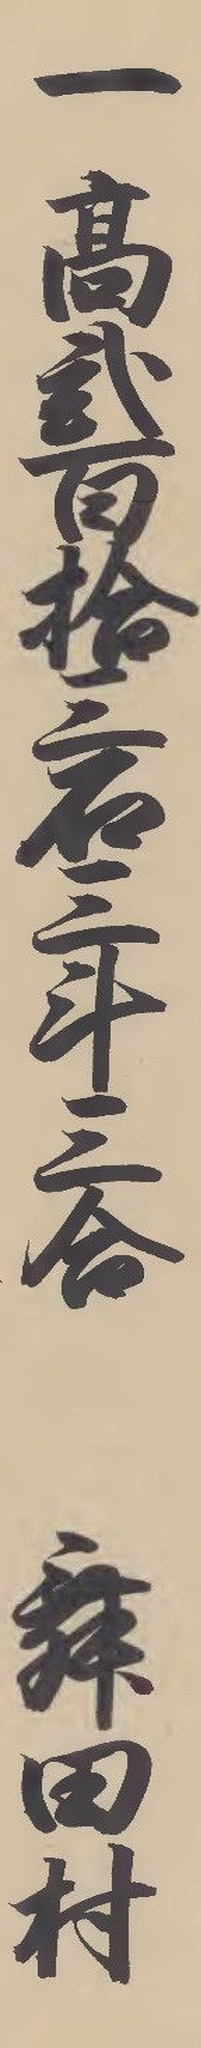一高弐百拾三石三斗三合舞田村
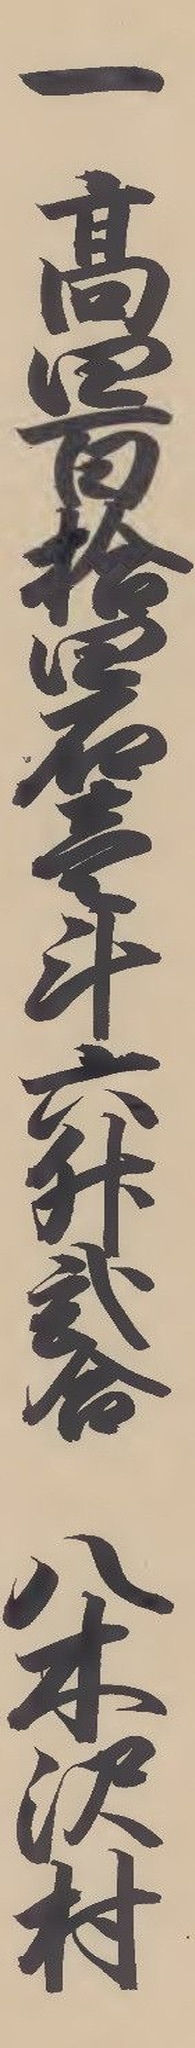一高四百拾四石壱斗六升弐合八木沢村
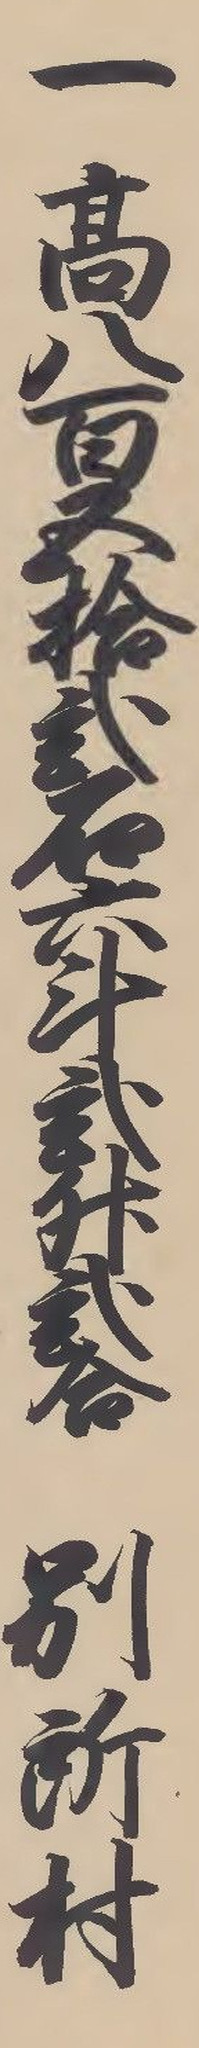一高八百五拾弐石六斗弐升弐合別所村
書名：信濃国郷帳
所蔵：国立公文書館 National Archives of Japan
